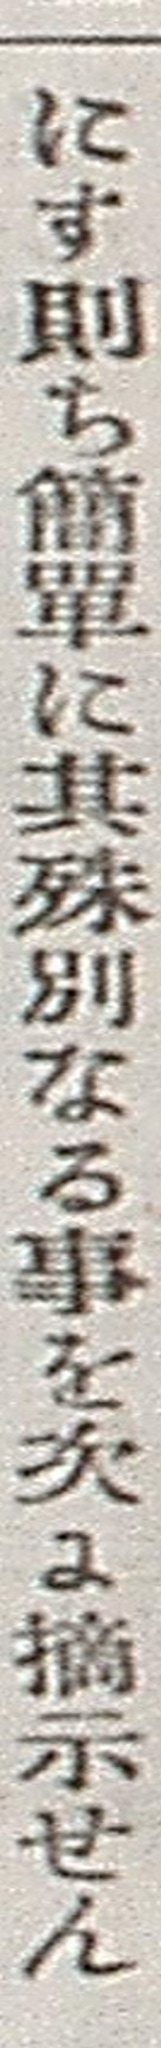にす則ち簡単に其殊別なる事を次に摘示せん
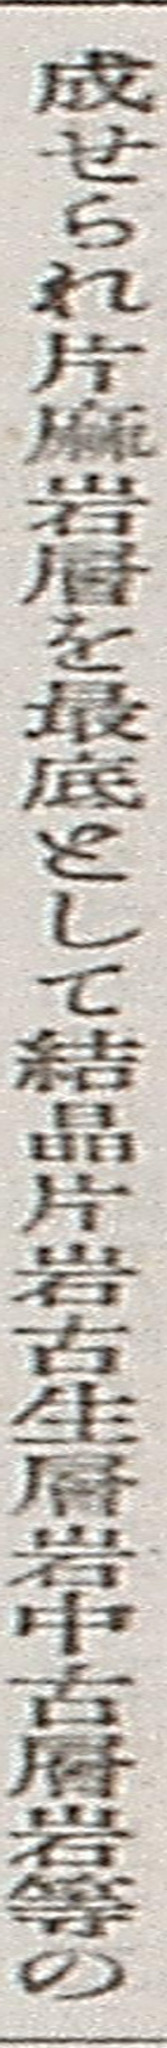成せられ片麻岩層を最底として結晶片岩古生層岩中古層岩等の
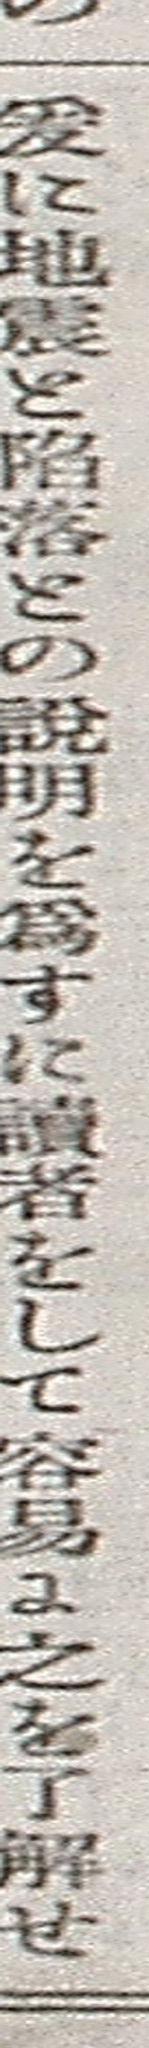爰に地震と陥落との説明を為すに読者をして容易に之を了解せ
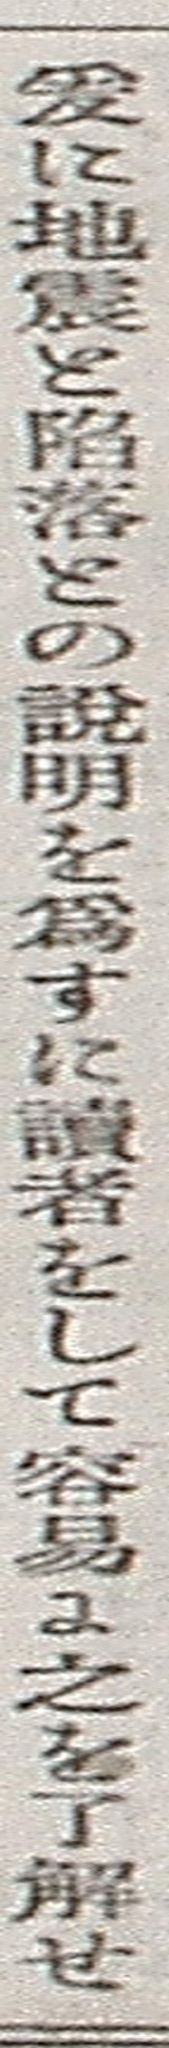爰に地震と陥落との説明を為すに読者をして容易に之を了解せ
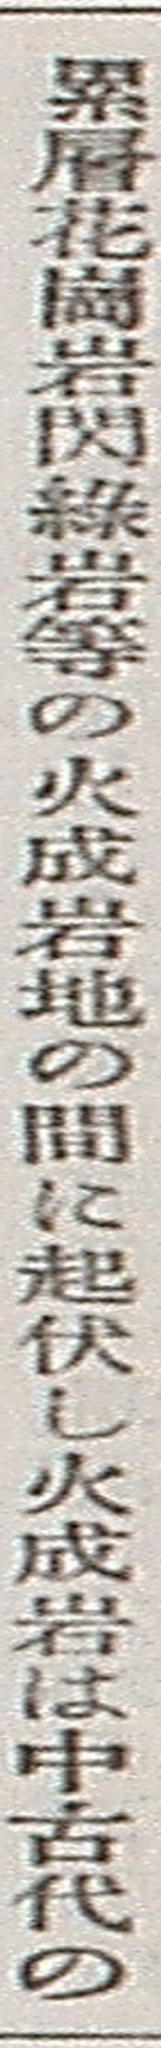累層花崗岩閃緑岩等の火成岩地の間に起伏し火成岩は中古代の
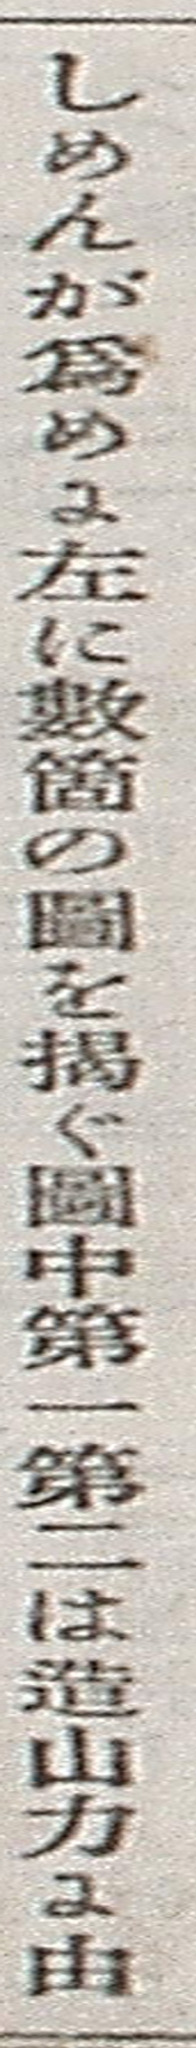しめんが為めに左に数箇の図を掲ぐ図中第一第二は造山力に由
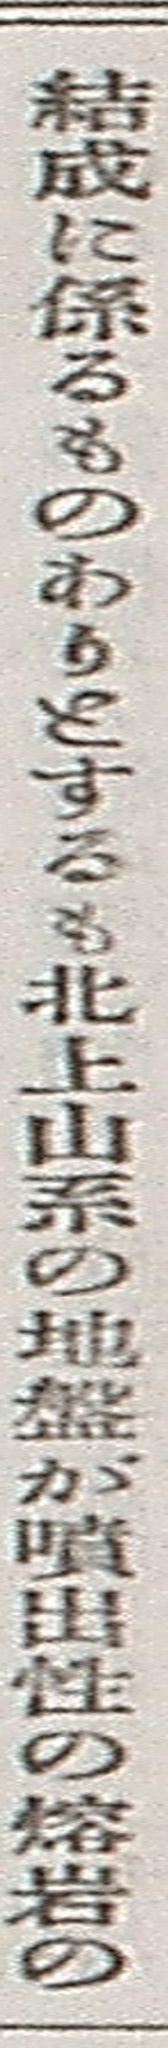結成に係るものありとするも北上山系の地盤が噴出性の熔岩の
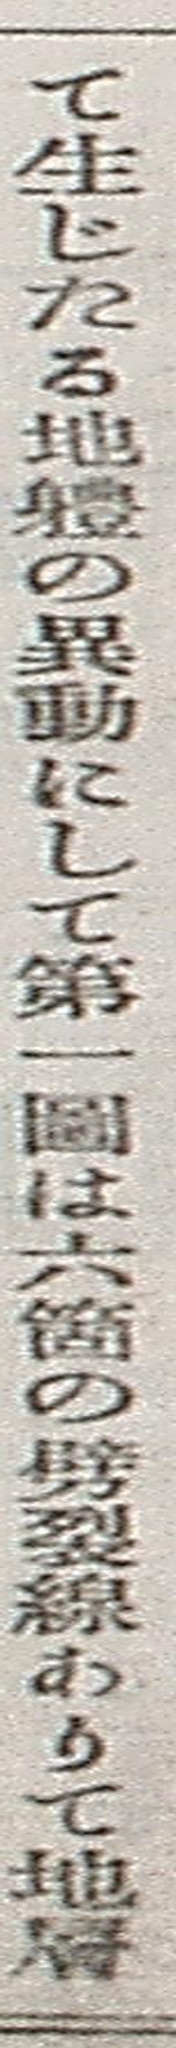て生じたる地体の異動にして第一図は六箇の劈裂線ありて地層
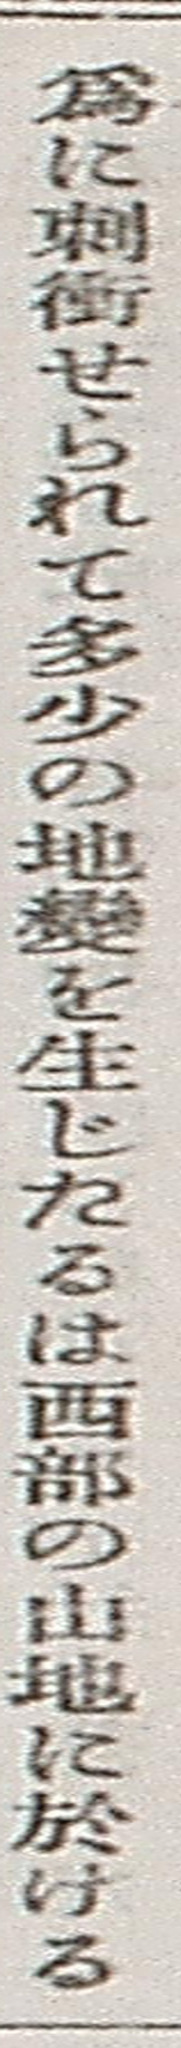為に刺衝せられて多少の地変を生じたるは西部の山地に於ける
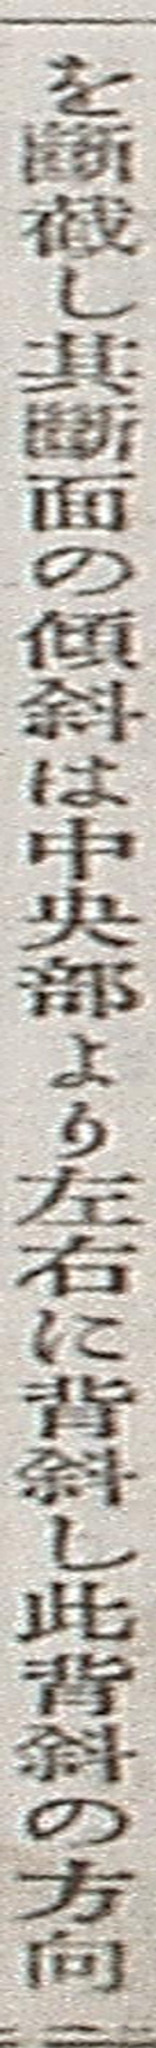を断裁し其断面の傾斜は中央部より左右に背斜し此背斜の方向

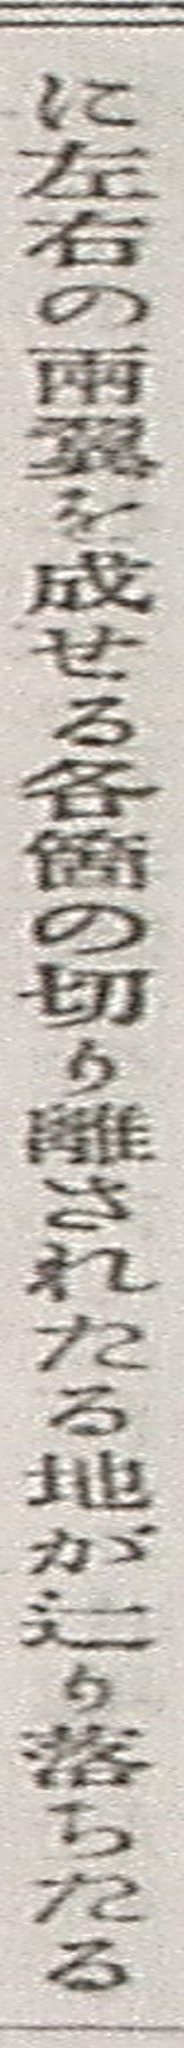に左右の両翼を成せる各箇の切り離されたる地が辷り落ちたる
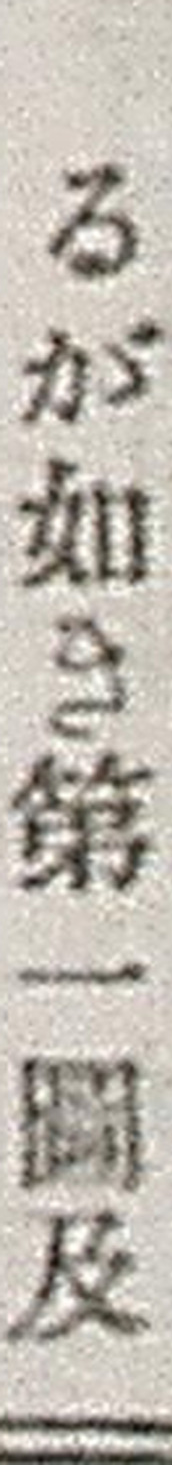るが如き第一図及
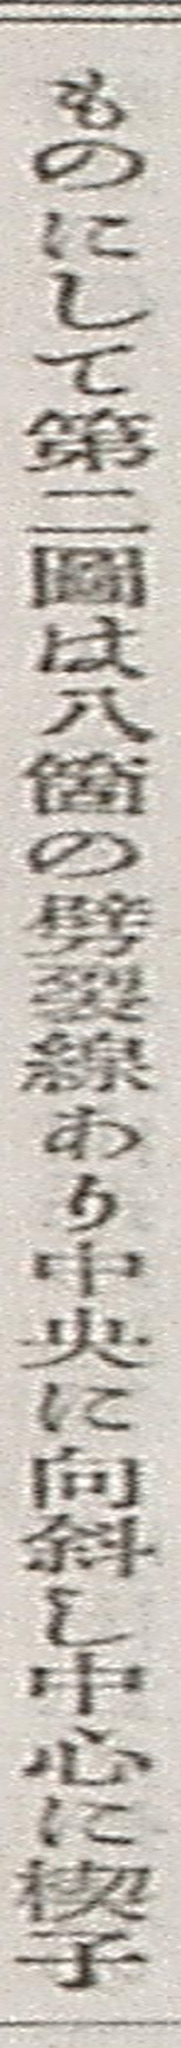ものにして第二図は八箇の劈裂線あり中央に向斜し中心に楔子
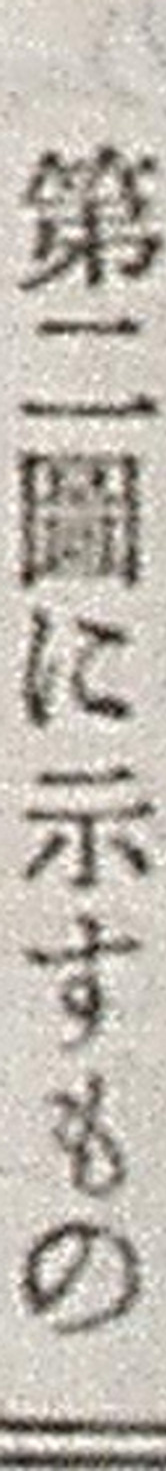第二図に示すもの
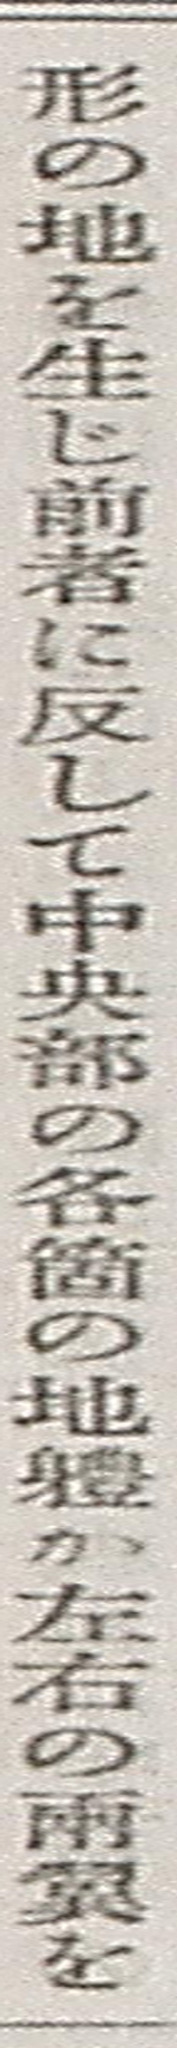形の地を生じ前者に反して中央部の各箇の地体か左右の両翼を
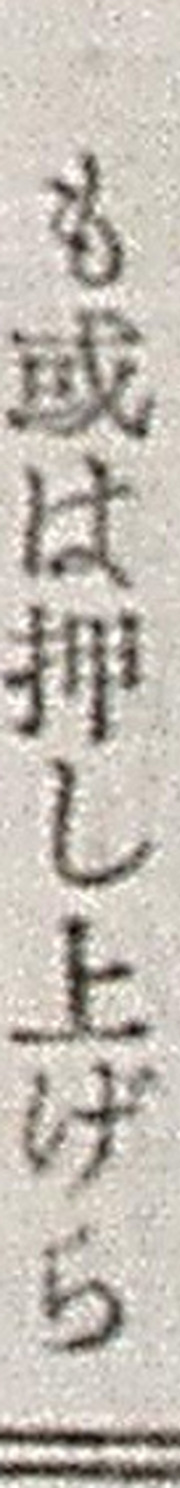も或は押し上げら
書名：風俗畫報臨時増刊第百二十號　大海嘯被害録（下）
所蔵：東京大学地震研究所図書室 Earthquake Research Institute Library, The University of Tokyo, JAPAN
